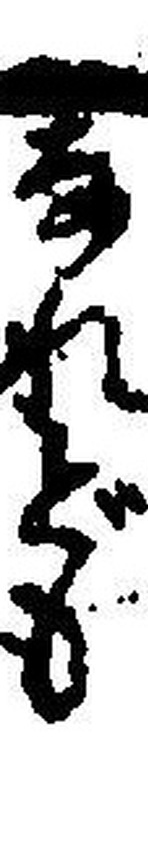なれども
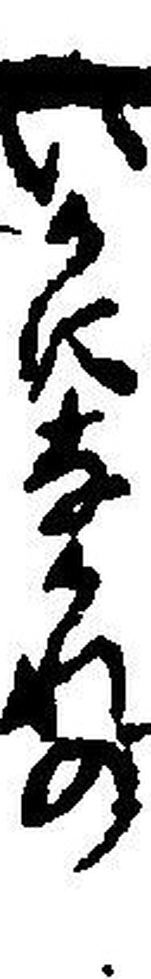いかになかれの
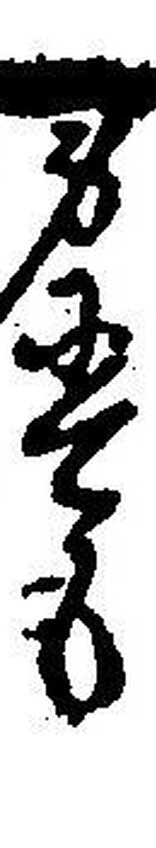身にても
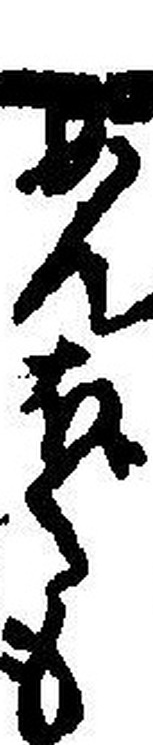めんぼくも
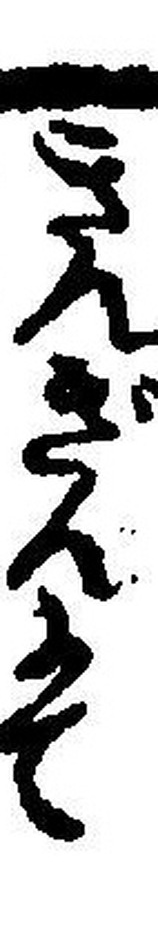きんぎんにて
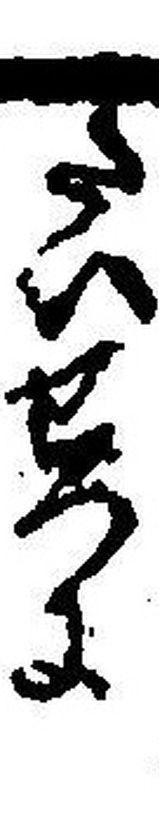たいせつに
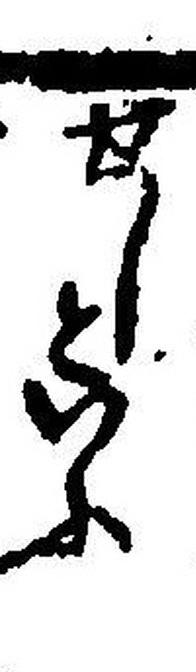せしといふ
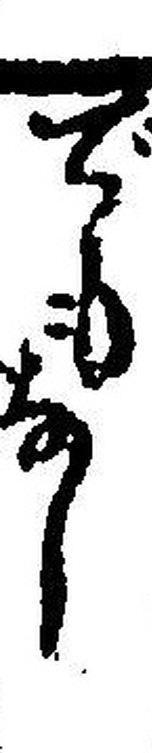でもなし
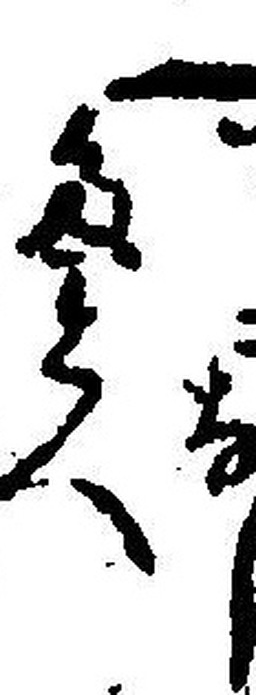たとへ
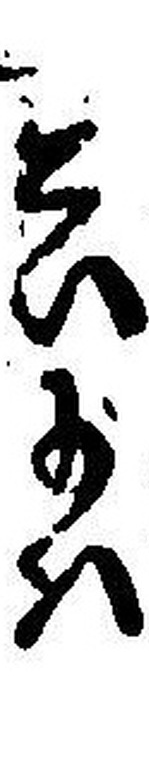こいには
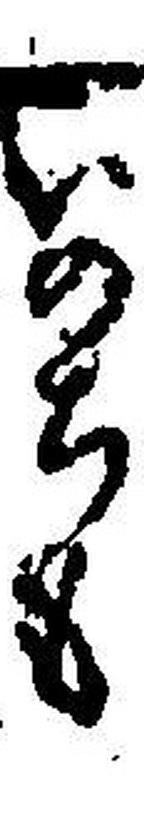いのちも
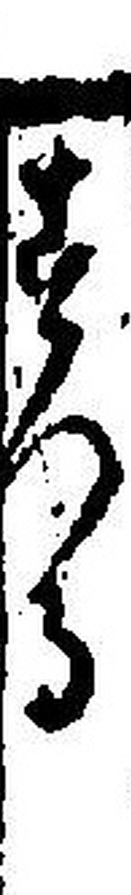すつる
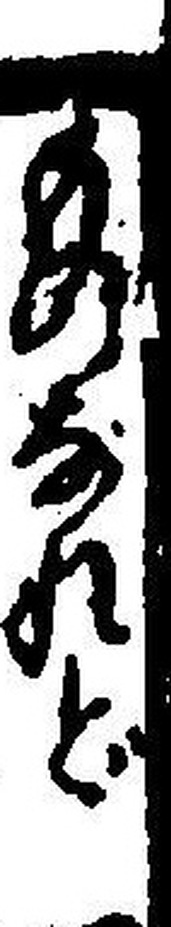ものなれど
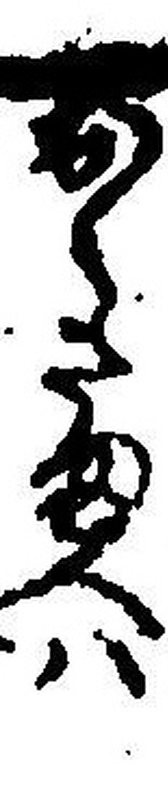おくさまへは
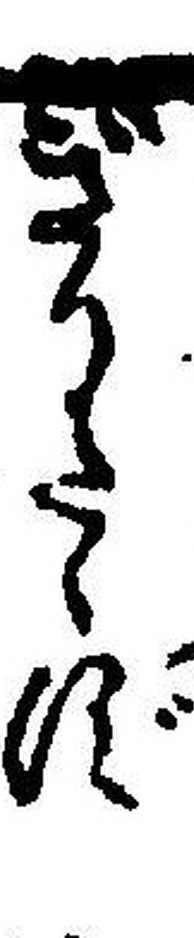ぎりたゝず
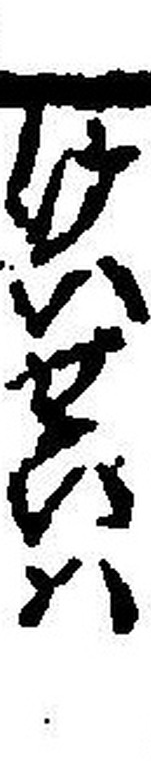けいせいは
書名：御代参牛時詣 / 市場通笑作
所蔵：東京大学総合図書館 General Library in the University of Tokyo, JAPAN
